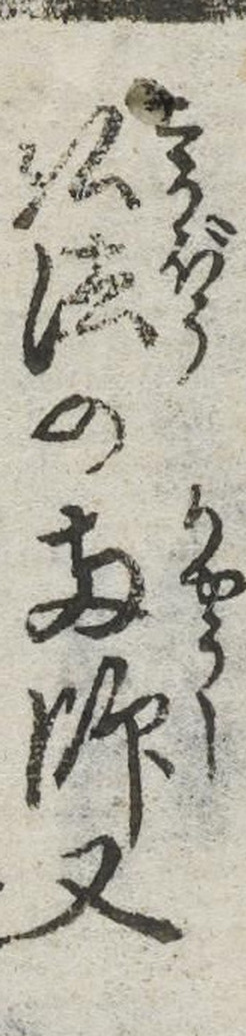弘法の両師又
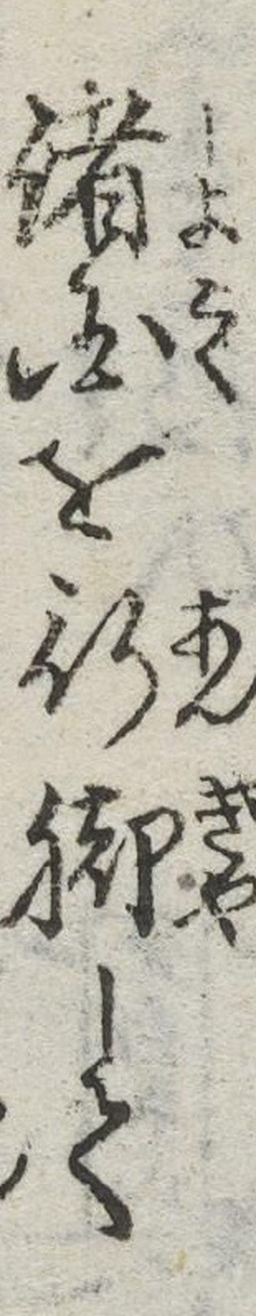諸国を行脚して
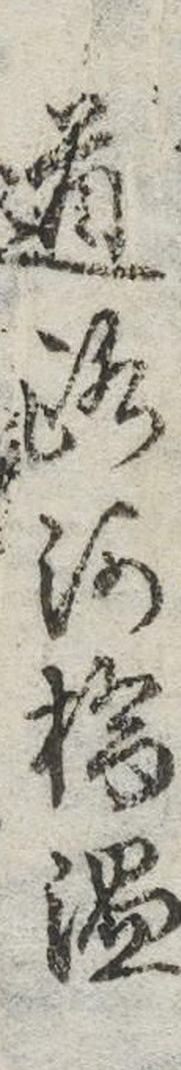道路河橋温
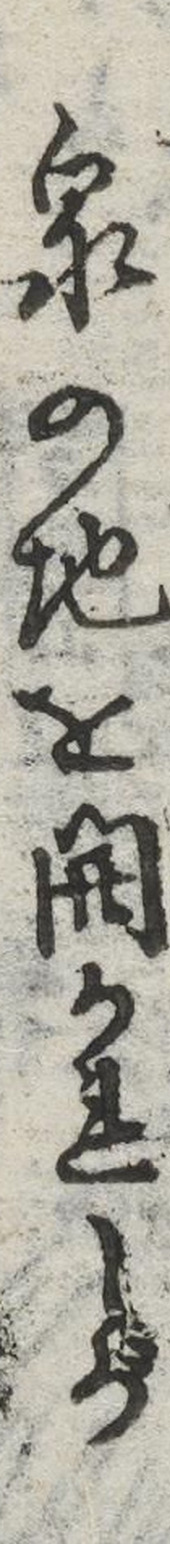泉の地を開かれしが
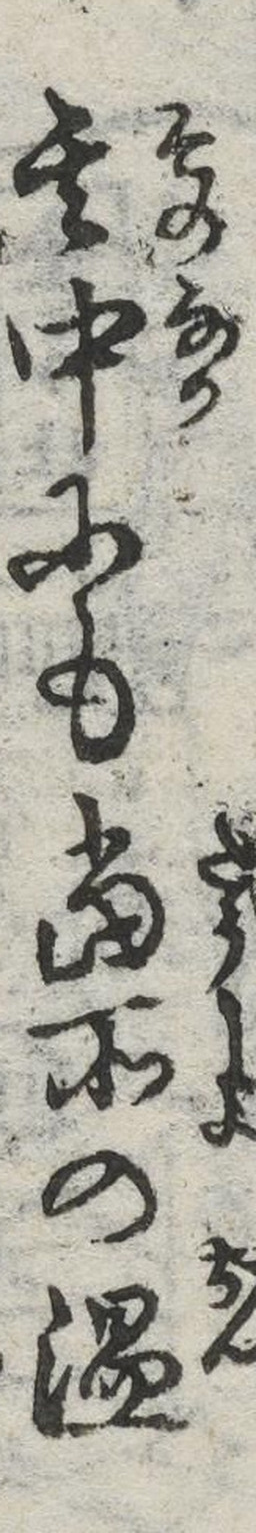其中にも当所の温
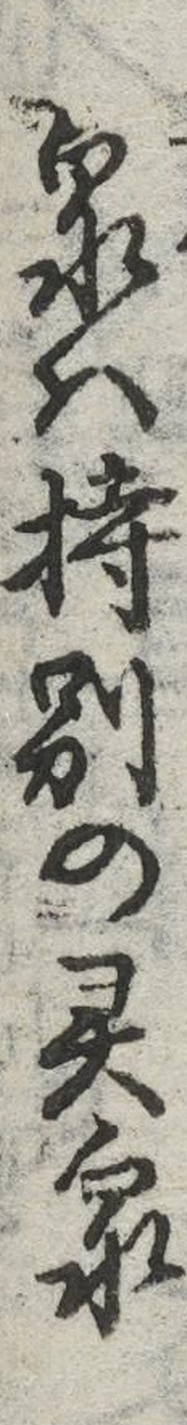泉は特別の霊泉
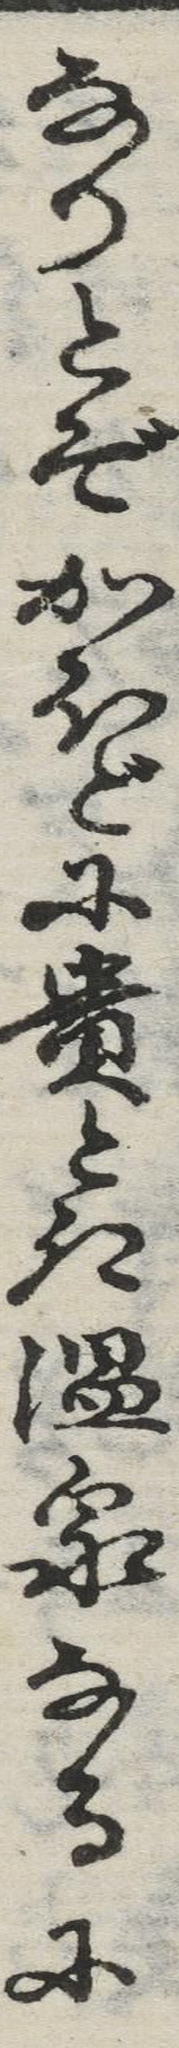なりとぞかほどに貴とき温泉なるに
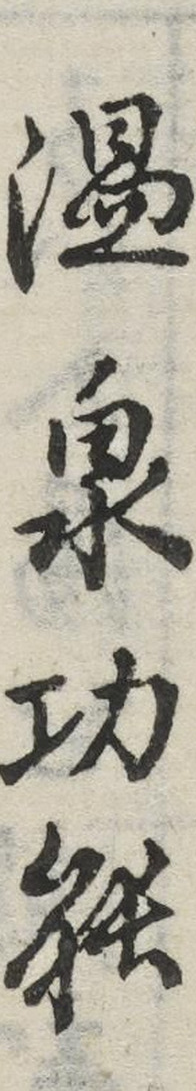温泉効能
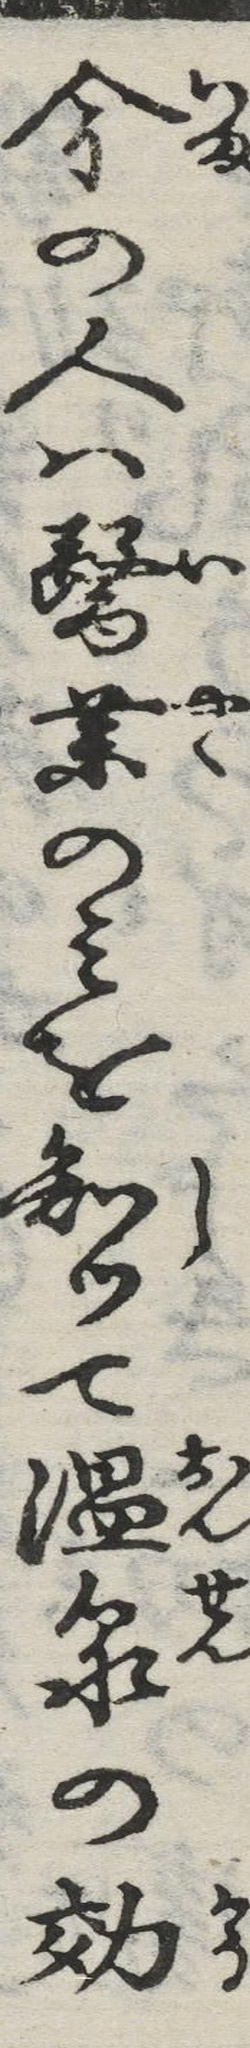今の人は医薬のみを知つて温泉の効
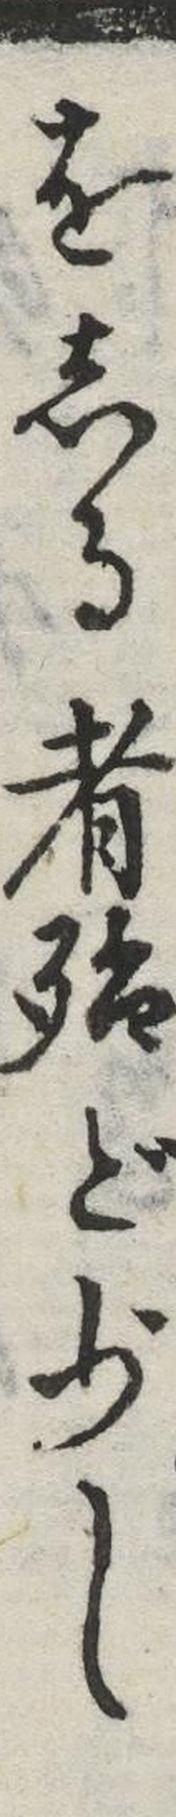をしる者殆ど少し
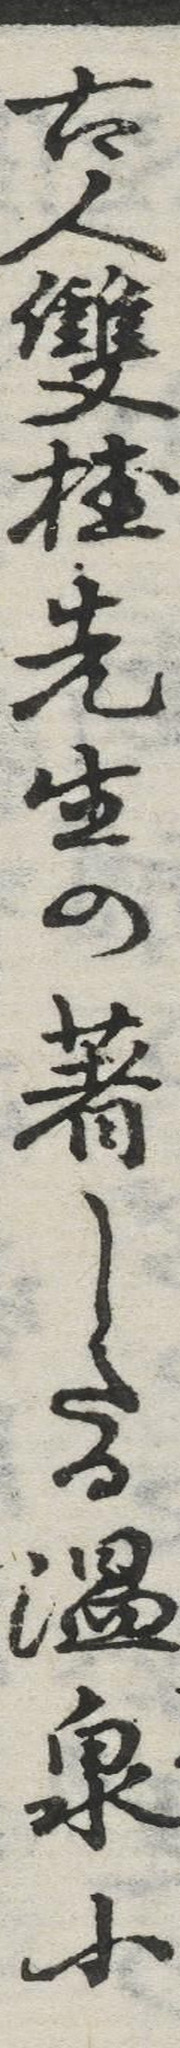古人双桂先生の著したる温泉小
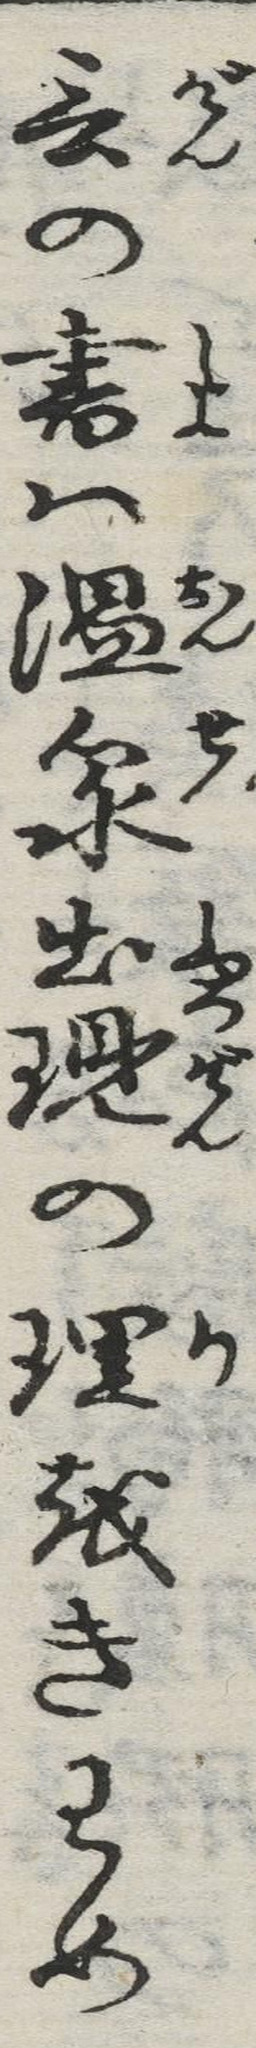言の書は温泉出現の理をきわめ
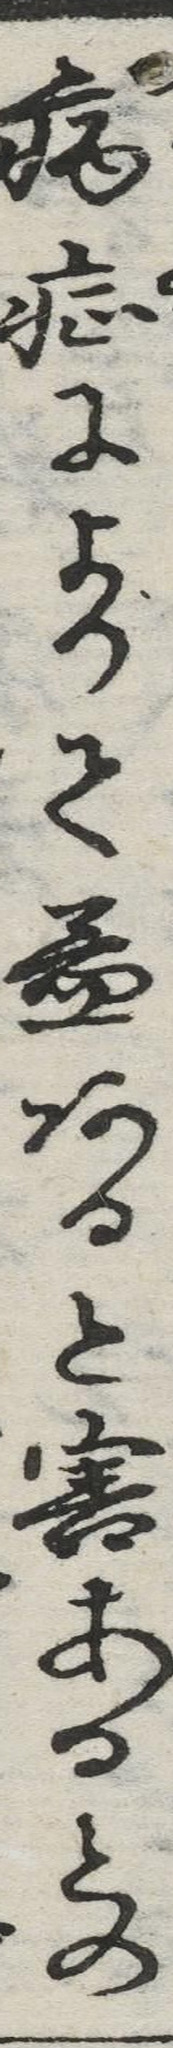病症によつて益あると害あるとの
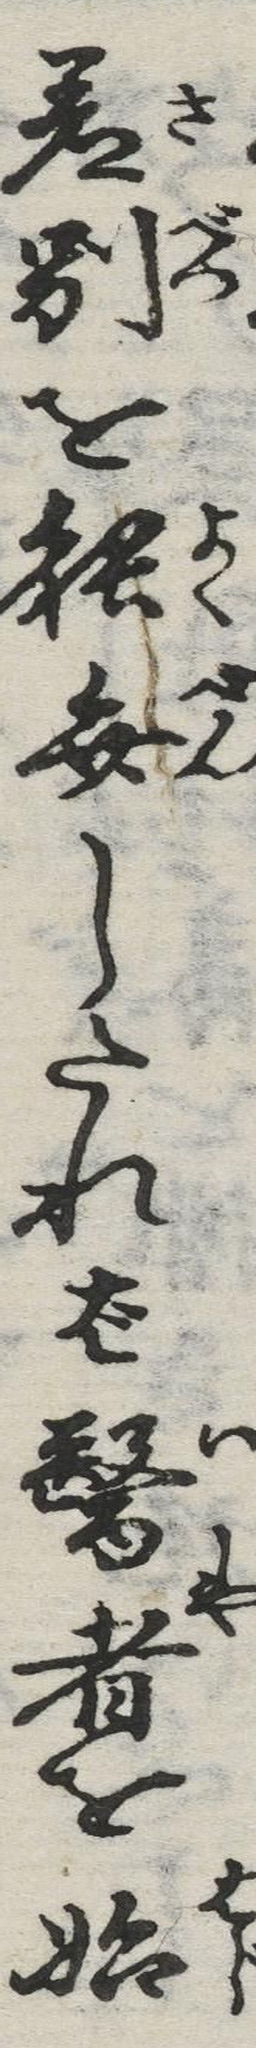差別を能弁したれば医者を始
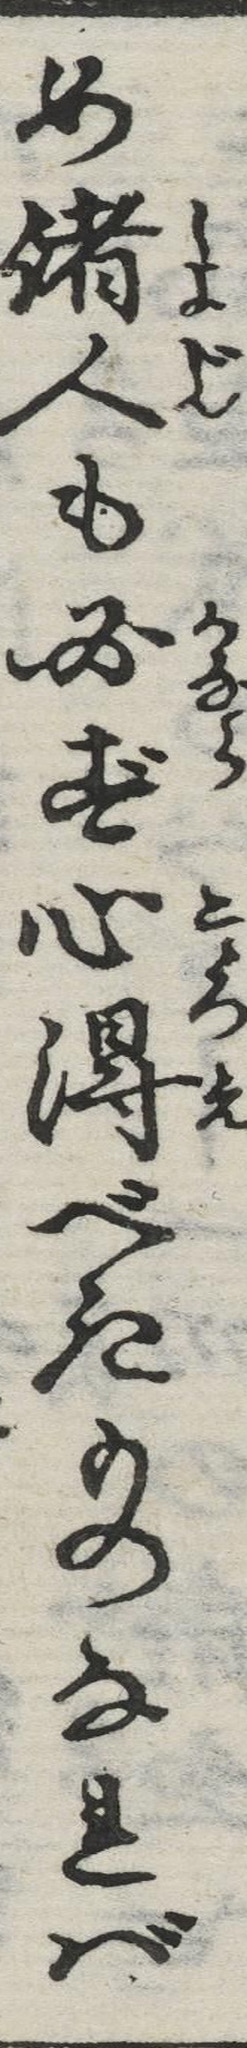め諸人も必ず心得べきものなれば
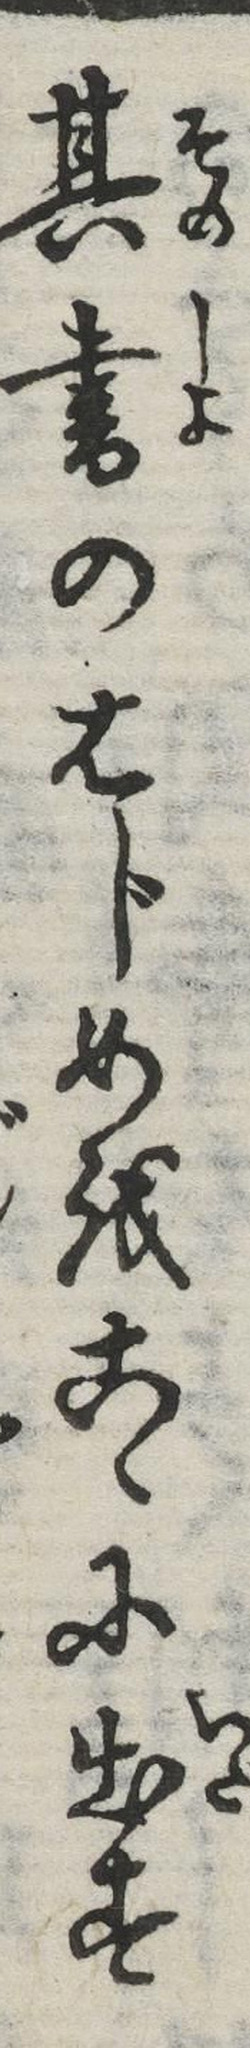其書のはじめをこゝに出す
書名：諸國温泉遊覽記　全
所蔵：東京大学地震研究所図書室 Earthquake Research Institute Library, The University of Tokyo, JAPAN
